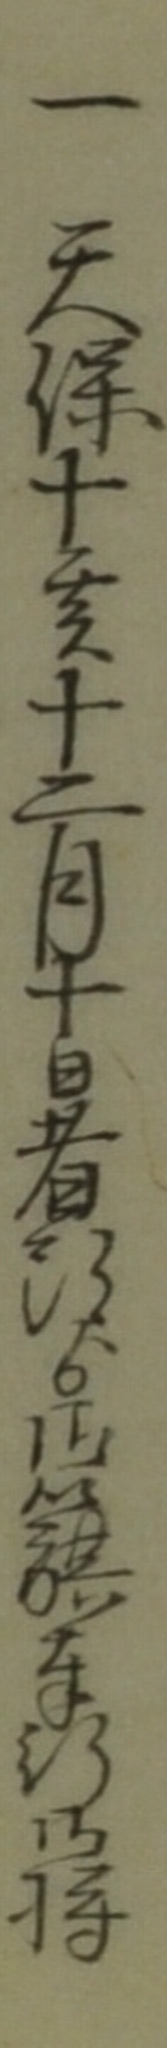一天保十亥十二月十日者頭ゟ御籏奉行御持
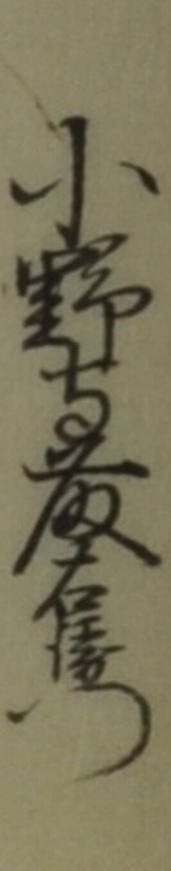小野寺藤右衛門
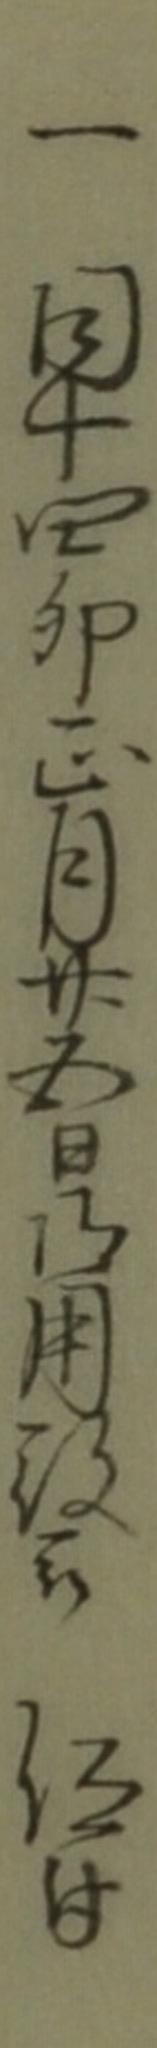一同十四卯正月廿五日御用役被仰付
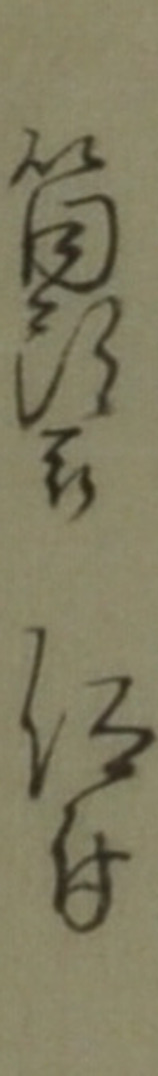筒頭被仰付
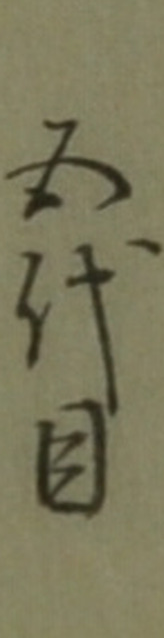五代目
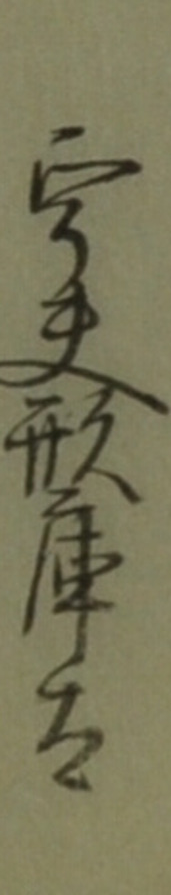宇夫形庫太
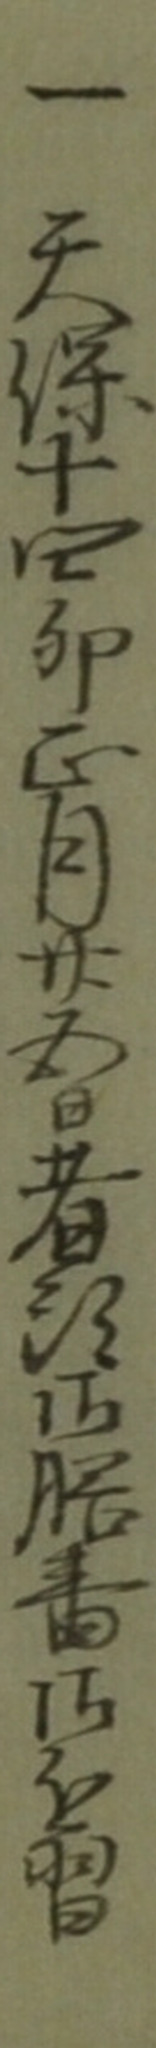一天保十四卯正月廿五日者頭ゟ御持筒頭
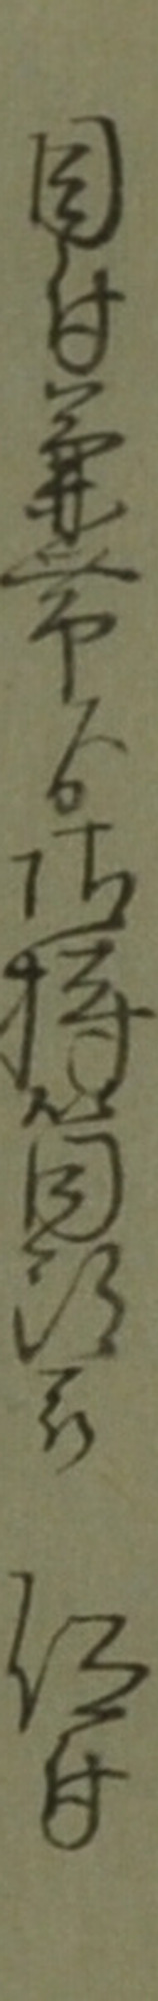大目付兼帯御持筒頭被仰付
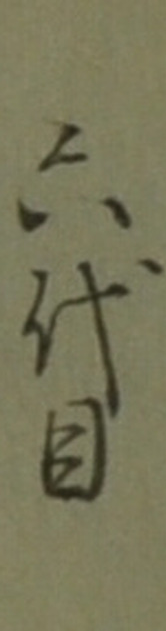四代目
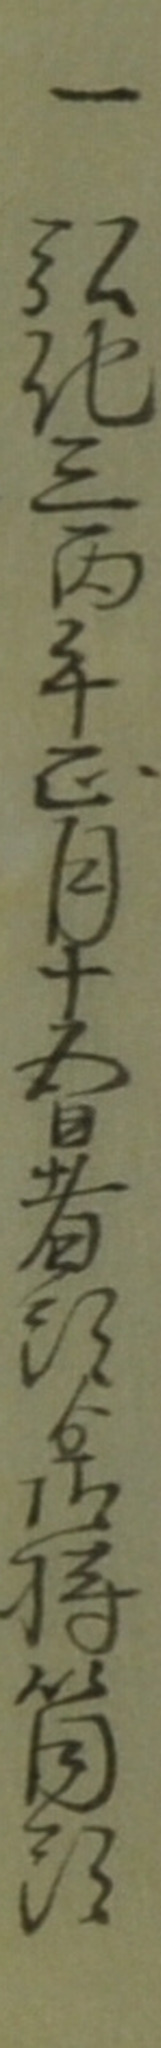一天保十四卯正月廿五日者頭ゟ御持筒頭
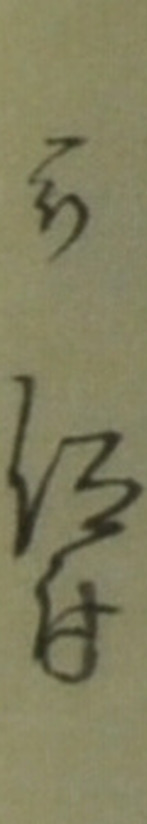被仰付

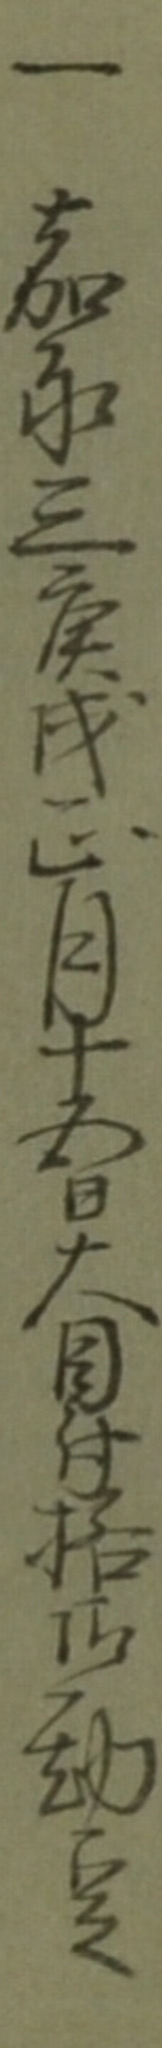一嘉永三庚戌正月十五日大目付格御勘定
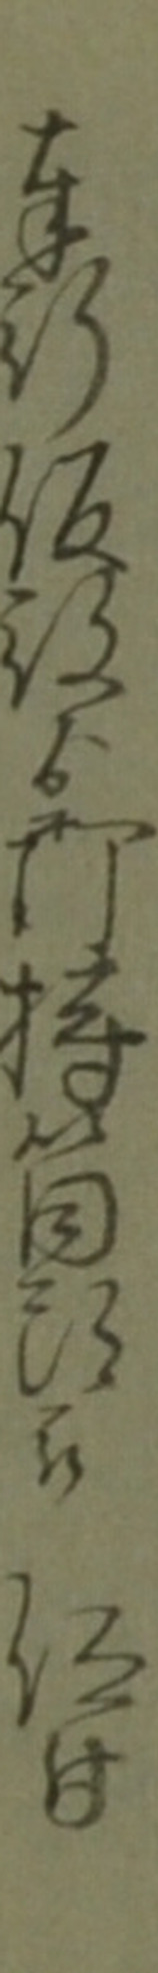奉行仮役ゟ御持筒頭被仰付
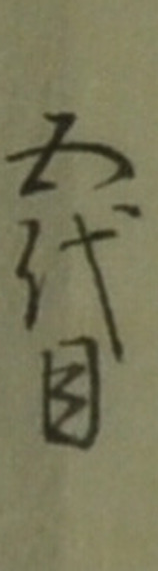五代目
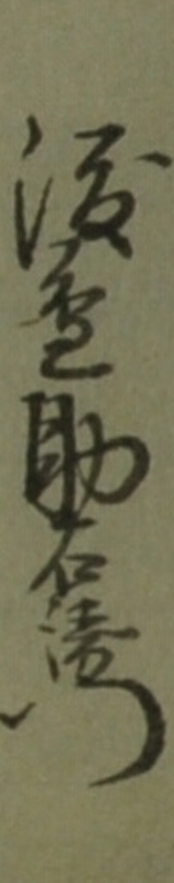渡邊助右衛門

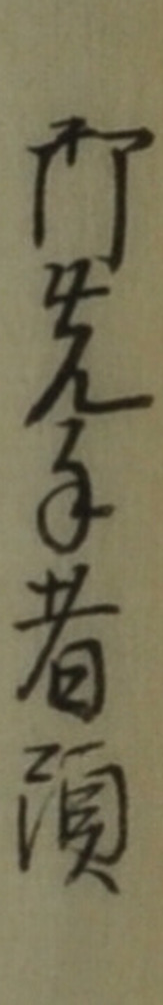御先手者預
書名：諸御役代々録（二）
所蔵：伊那市立高遠町図書館・合同会社AMANE
